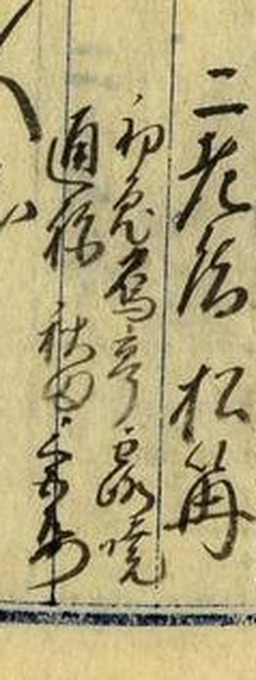初め蔦亭露暁
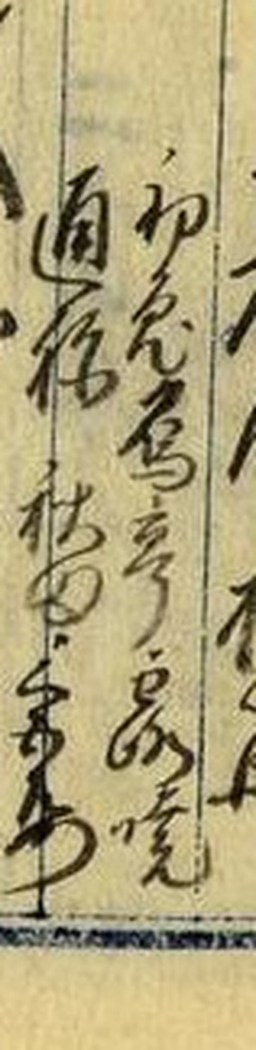通称秋田三五左衛門
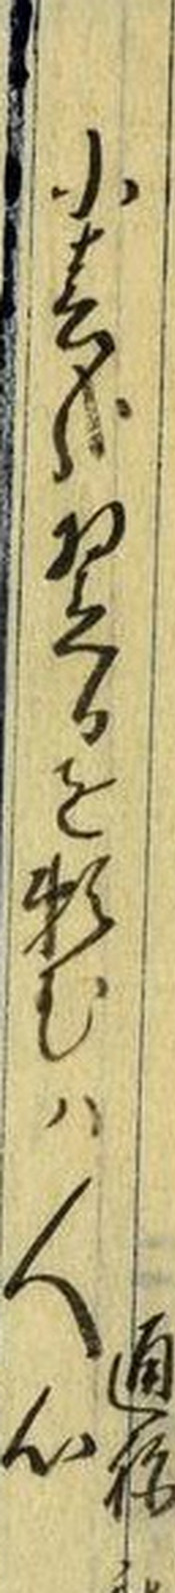小春哉翌日を頼むは人心
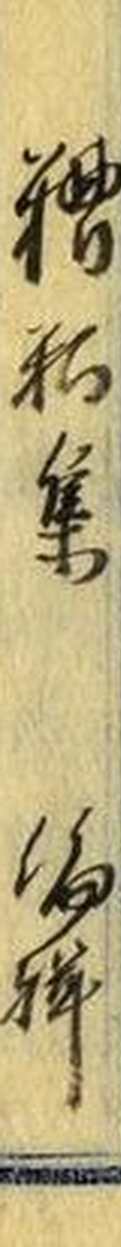糟粕集編輯
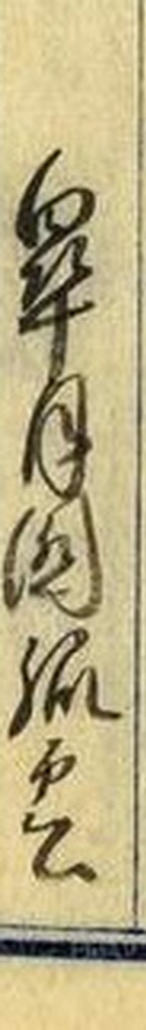皐月園孤雲
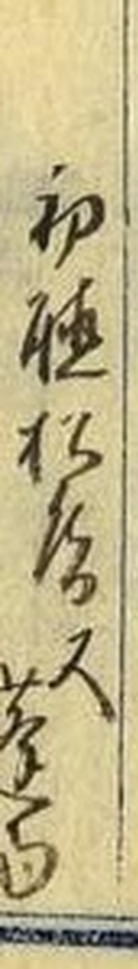初聴松庵又蓬雨
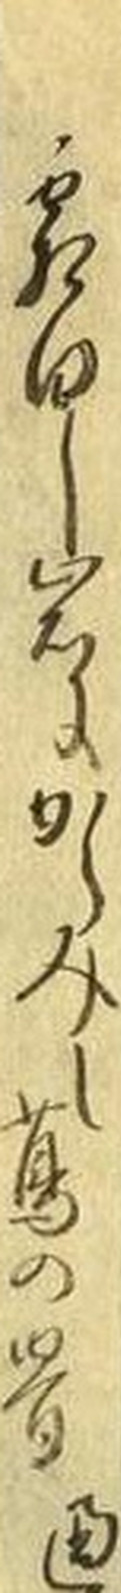霜白し岩にからみし蔦の骨
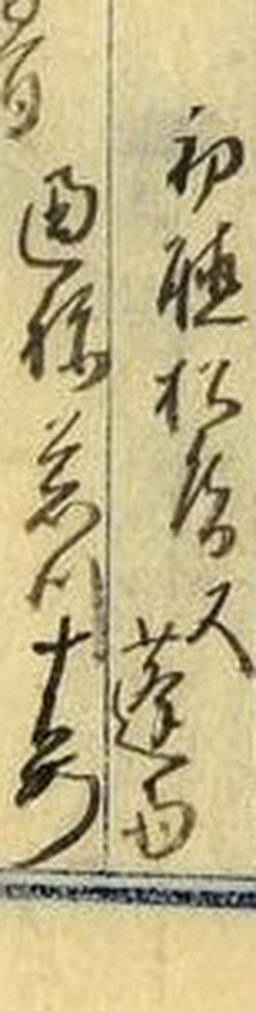通称荒川十右衛門
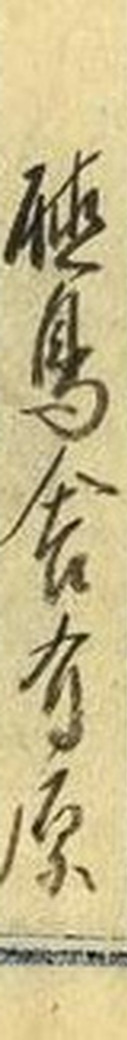聴鳥舎有原
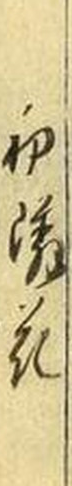初隣花
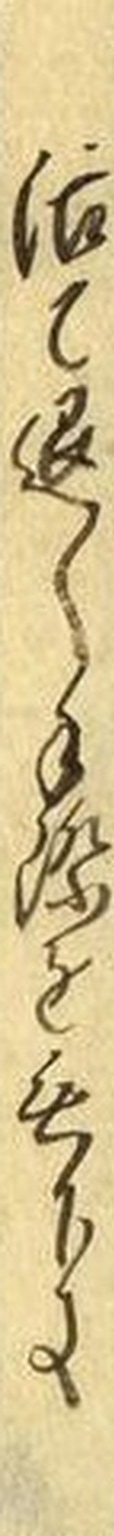活て退く手際を無下に
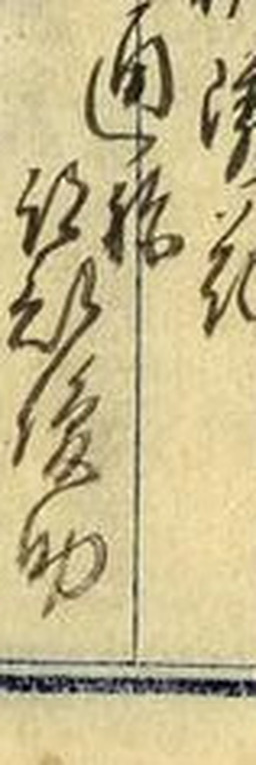跡部俊助

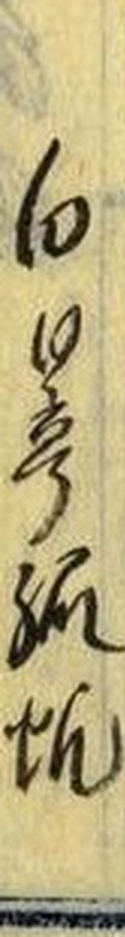白日亭孤帆
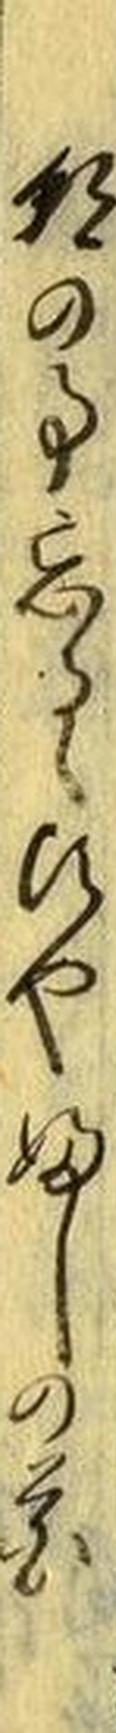朝の事忘るゝ頃やふしの花
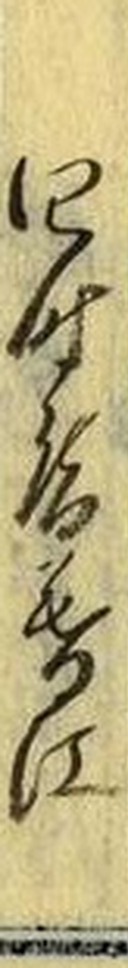四時庵暮江
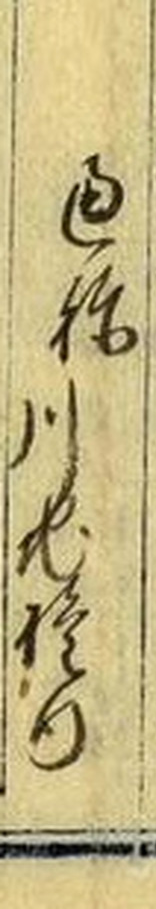通称川地権行
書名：温古集 三巻
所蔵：福井県文書館 Fukui Prefectural Archives
